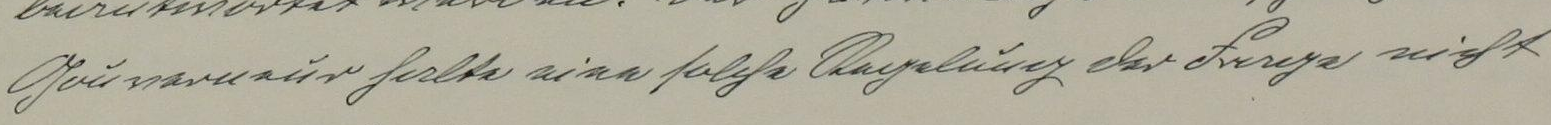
Gouverneur halte eine solche Regelung der Frage nicht
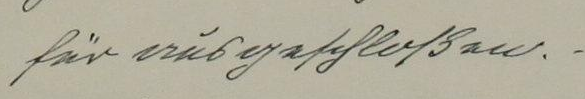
für ausgeschloßen.
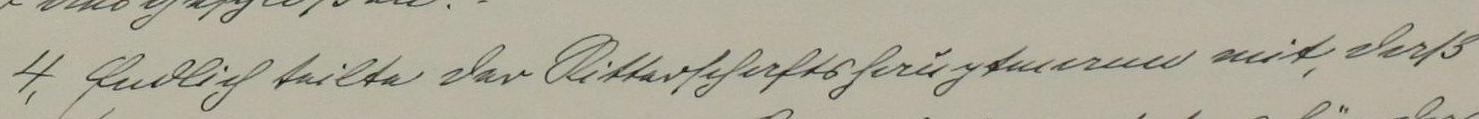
4. Endlich teilte der Ritterschaftshauptmann mit, daß
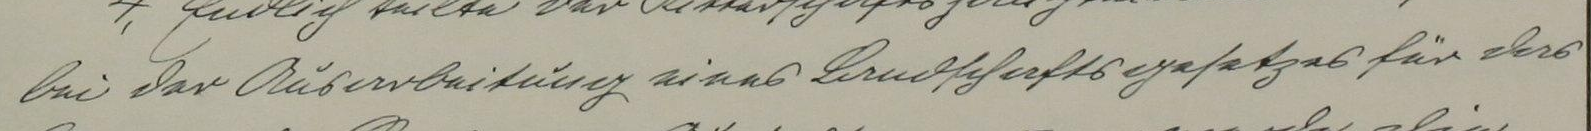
bei der Ausarbeitung eines Landschaftsgesetzes für das
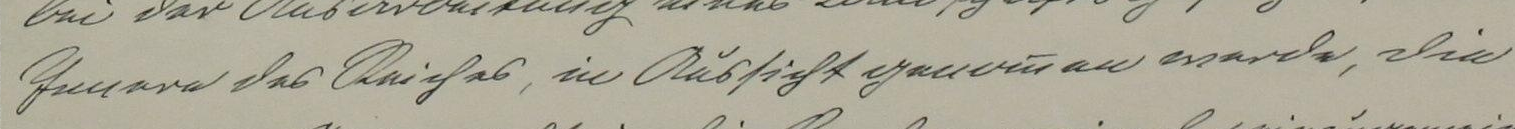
Innere des Reiches in Aussicht genommen werde, die
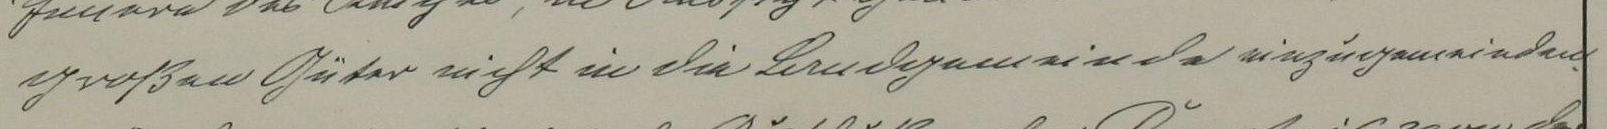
großen Güter nicht in die Landgemeinde einzugemeinden.
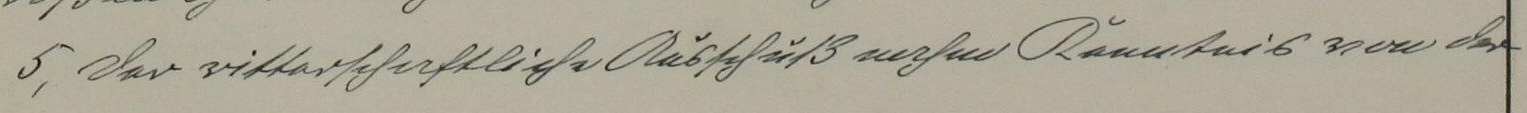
5. Der ritterschaftliche Ausschuß nahm Kenntnis von der
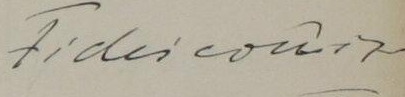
Fideicomiss
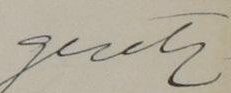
gesetz
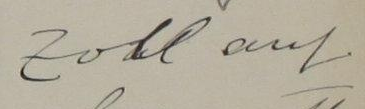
Zoll auf
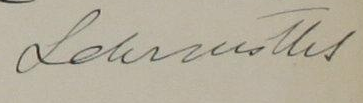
Lehrmittel
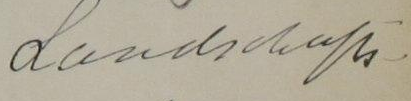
Landschafts-
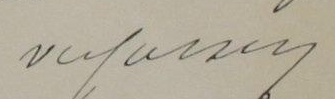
verfassung
